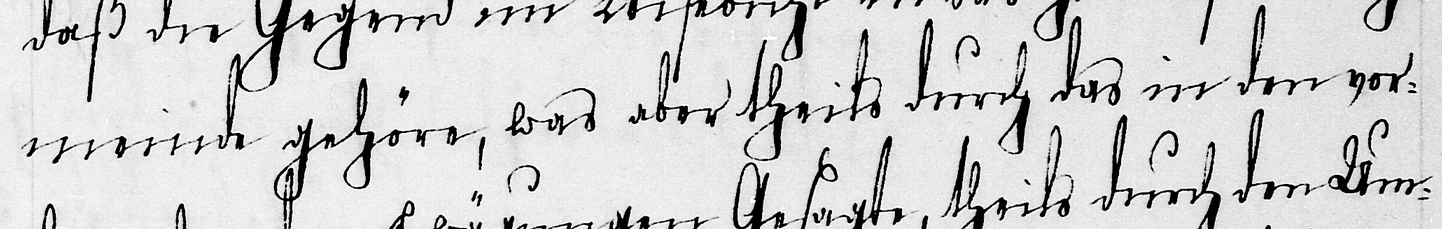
meinde gehöre, was aber theils durch das in dem vor¬
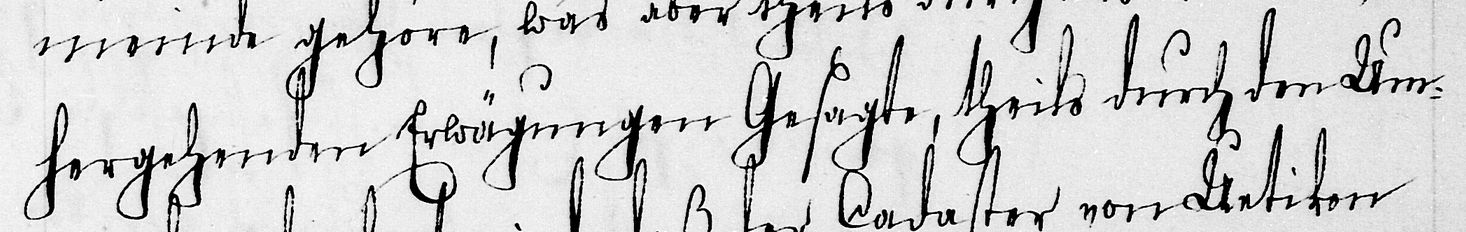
hergehenden Erwägungen Gesagte, theils durch den Um¬
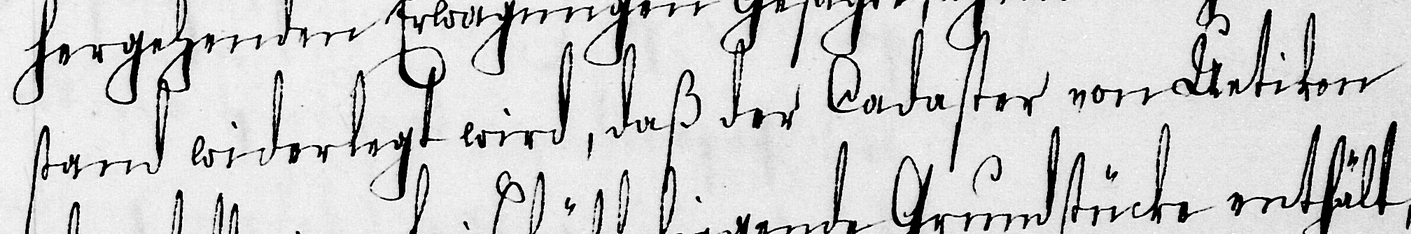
stand widerlegt wird, daß der Cadaster von Uetikon
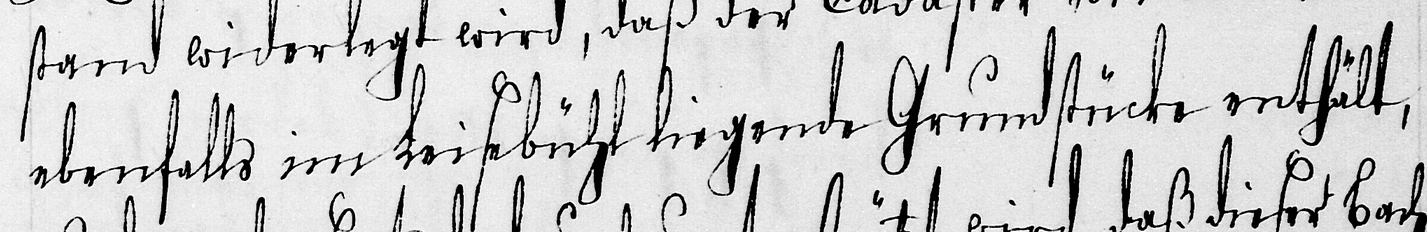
ebenfalls im Leisebühl liegende Grundstücke enthält,
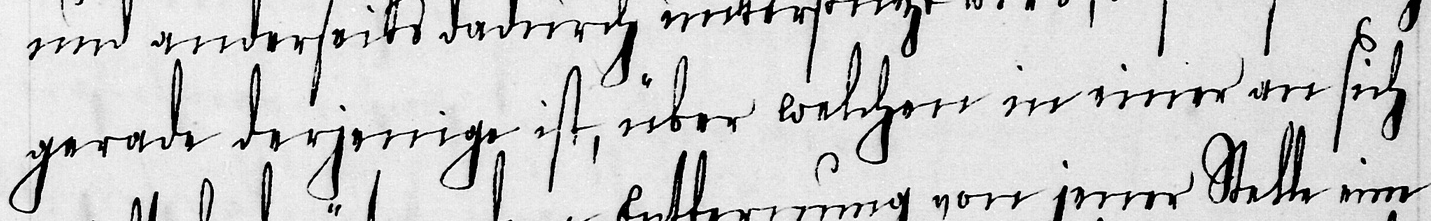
gerade derjenige ist, über welchen in einer an sich
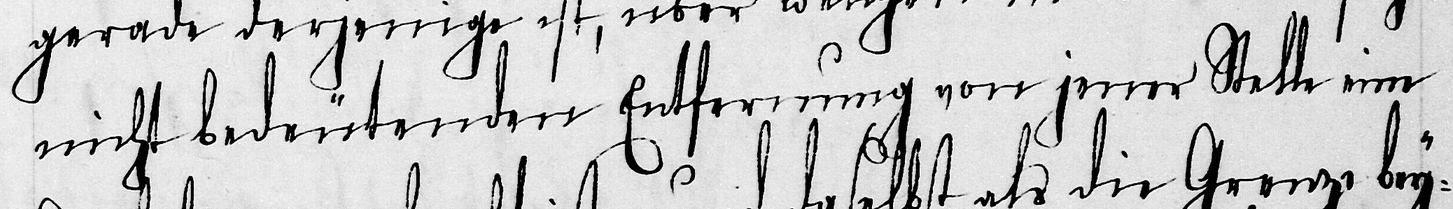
nicht bedeutenden Entfernung von jener Stelle eine
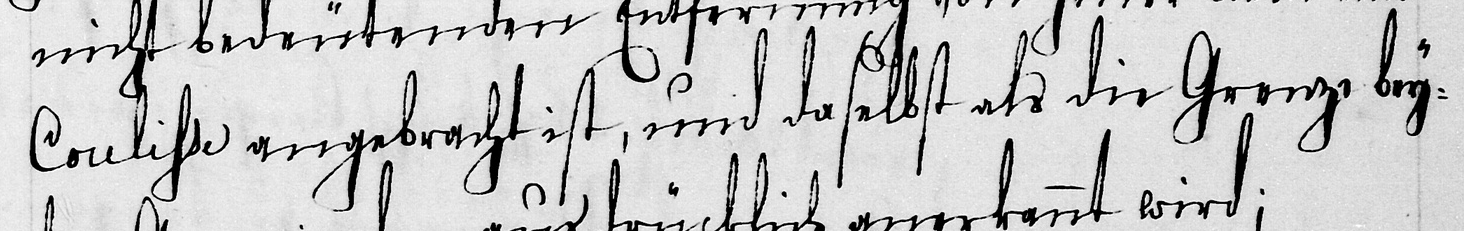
Coulisse angebracht ist, und daselbst als die Grenze bey¬
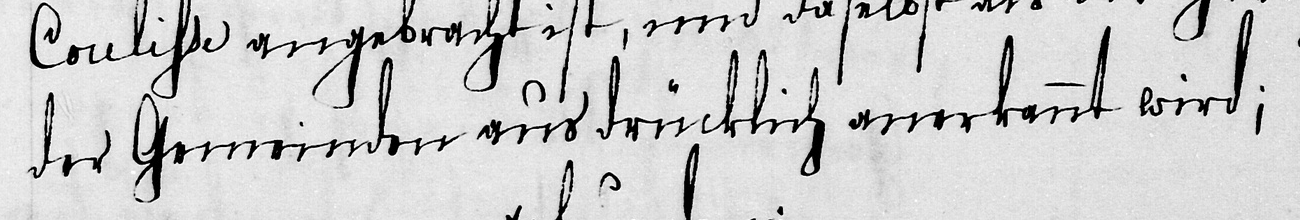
der Gemeinden ausdrücklich anerkannt wird;
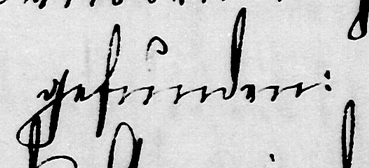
gefunden:
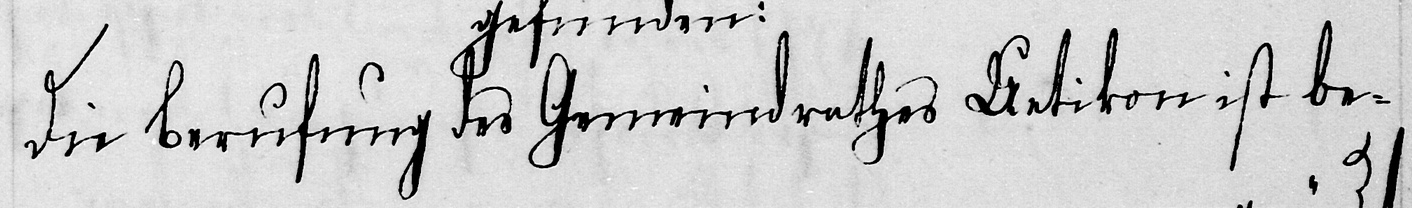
Die Berufung des Gemeindrathes Uetikon ist be-
